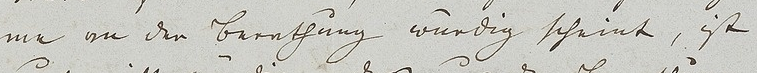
me an der Berathung würdig scheint, ist
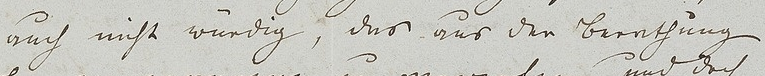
auch nicht würdig, das aus der Berathung
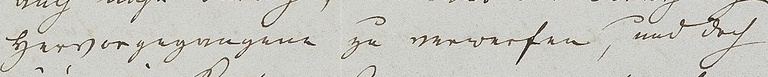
Hervorgegangene zu verwerfen, und doch
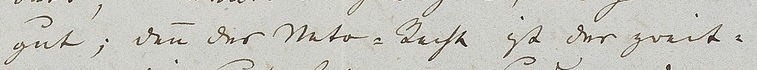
gut; denn das Veto-Recht ist das zweit-
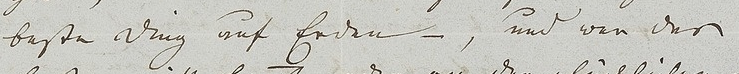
beste Ding auf Erden –, und wer das
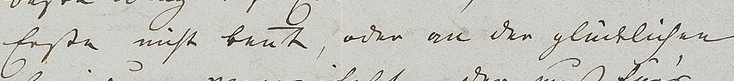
Erste nicht kennt, oder an der glücklichen
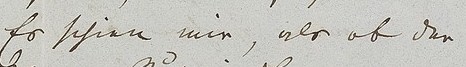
Es schien mir, als ob der
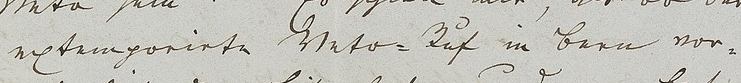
extemporirte Veto-Ruf in Bern vor-
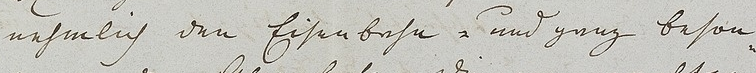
nehmlich den Eisenbahn- und ganz beson-
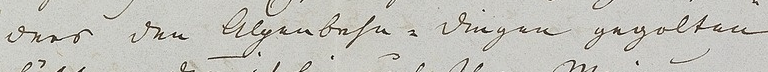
ders den Alpenbahn-Dingen gegolten
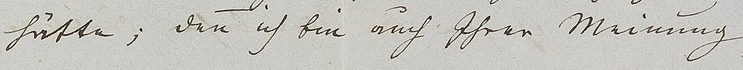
hätte; denn ich bin auch Ihrer Meinung,
